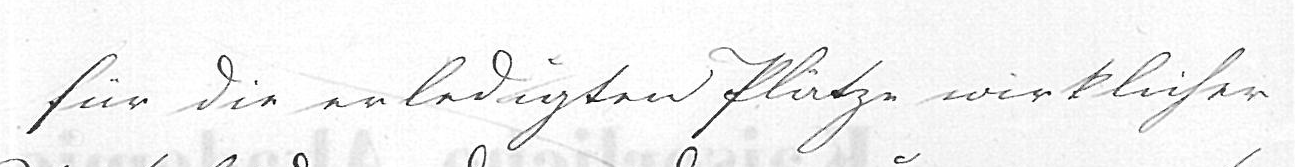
für die erledigten Plätze wirklicher
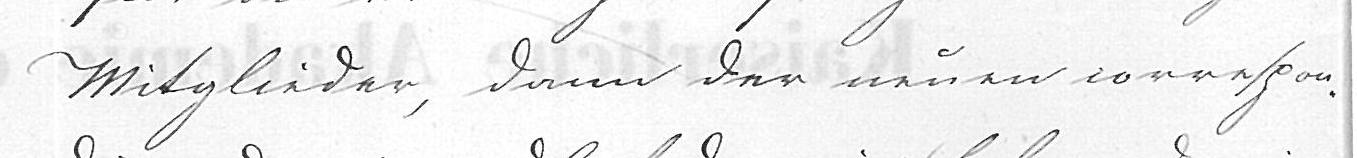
Mitglieder, dann der neuen correspon-
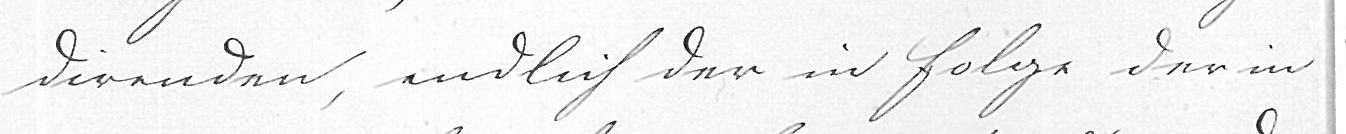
direnden, endlich der in Folge der in
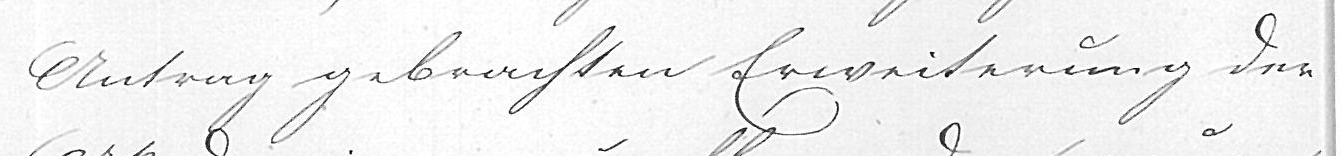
Antrag gebrachten Erweiterung der
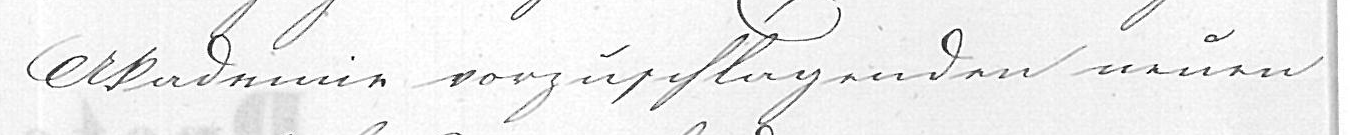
Akademie vorzuschlagenden neuen
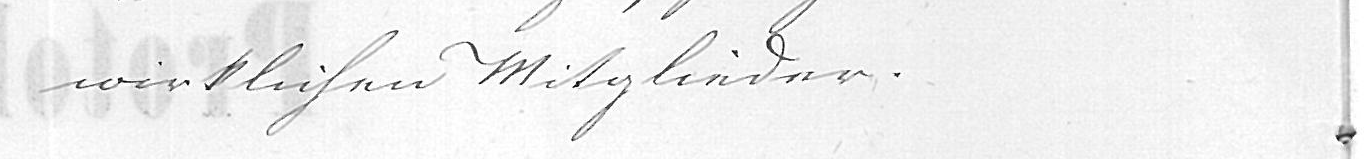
wirklichen Mitglieder.
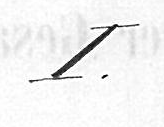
I.
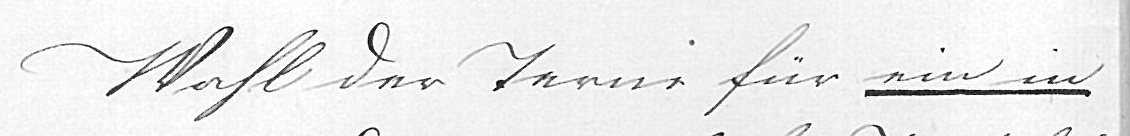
Wahl der Terne für ein in
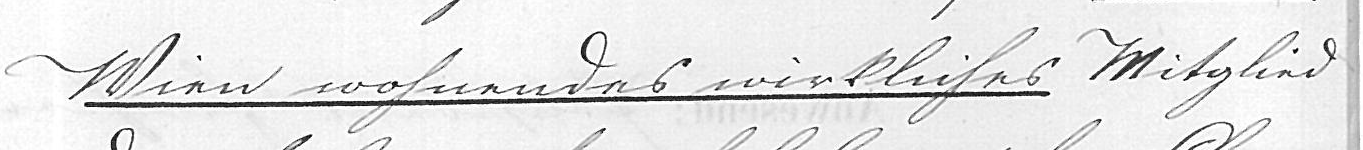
Wien wohnendes wirkliches Mitglied
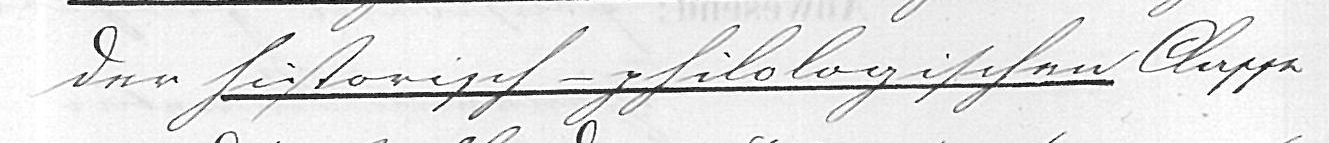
der historische-philologischen Classe
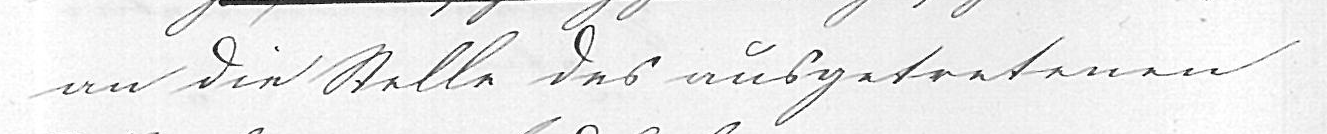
an die Stelle des ausgetretenen
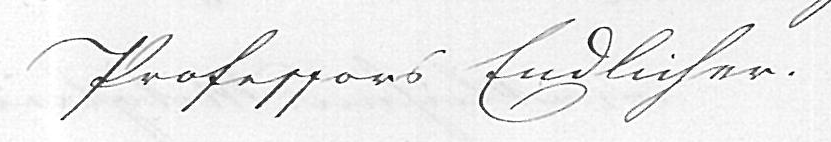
Professors Endlicher.
